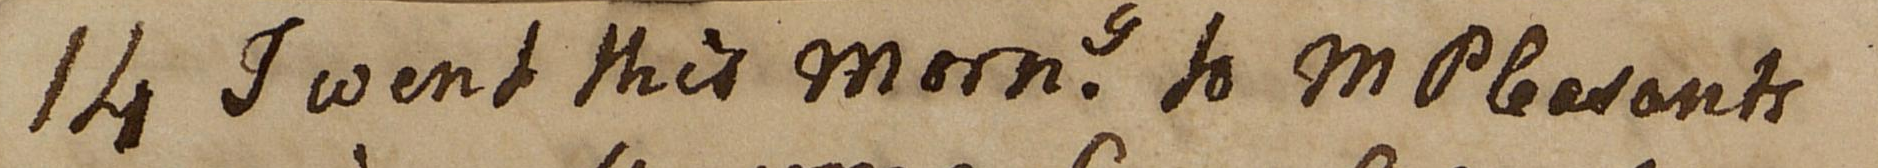14 I went this Morn^g. to M Pleasants
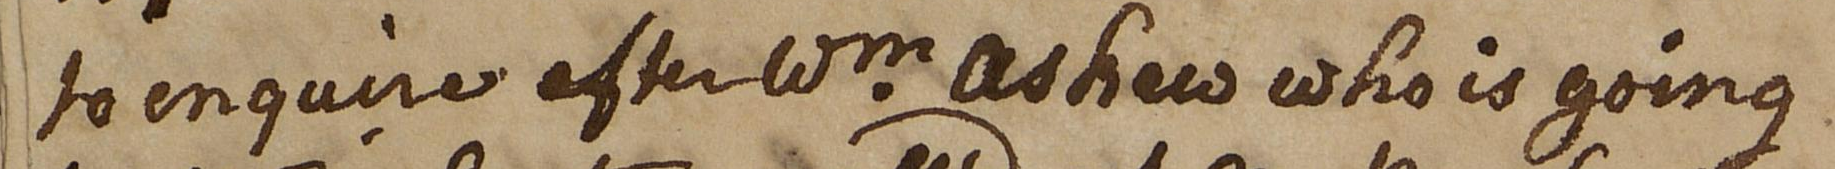to enquire after W^m. Askew who is going
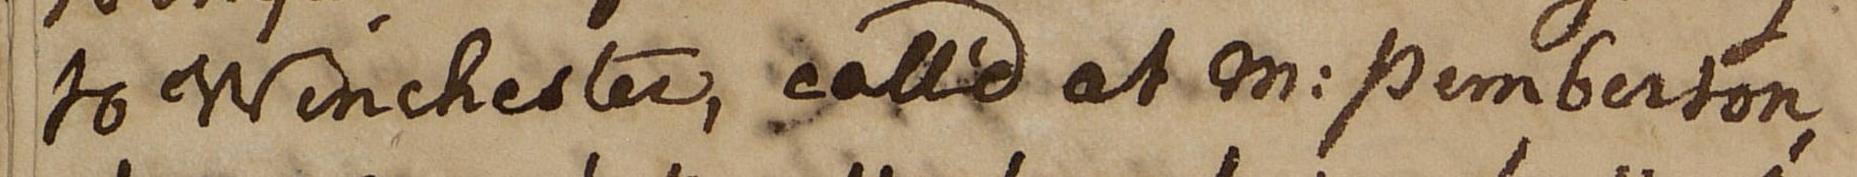to Winchester, call'd at M: Pemberton,
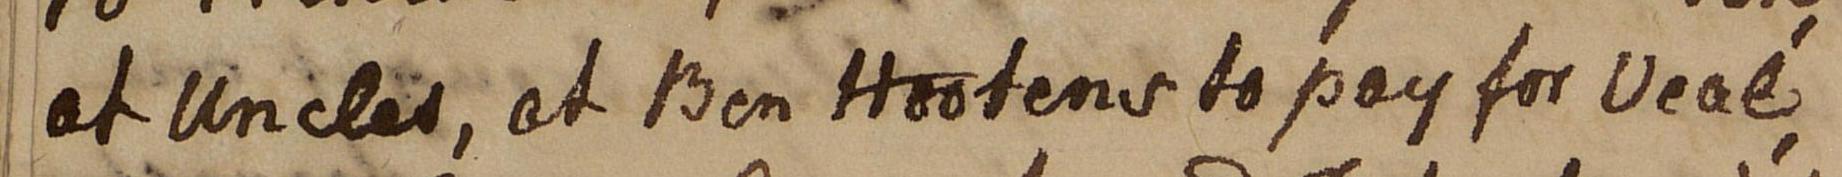at Uncles, at Ben Hootens to pay for Veal
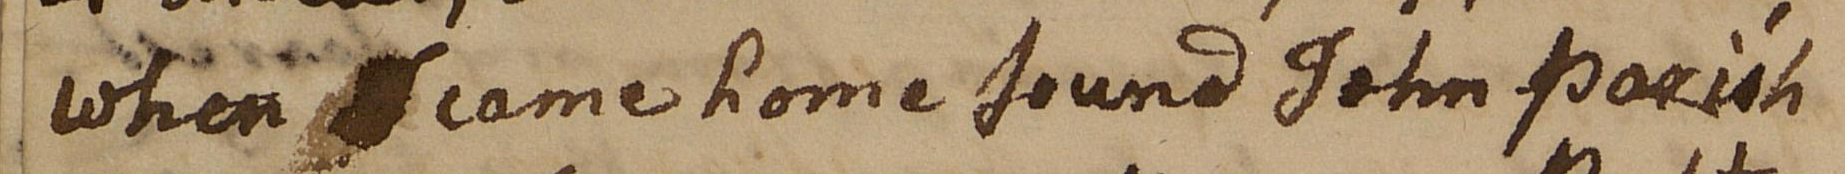when I came home found John parish
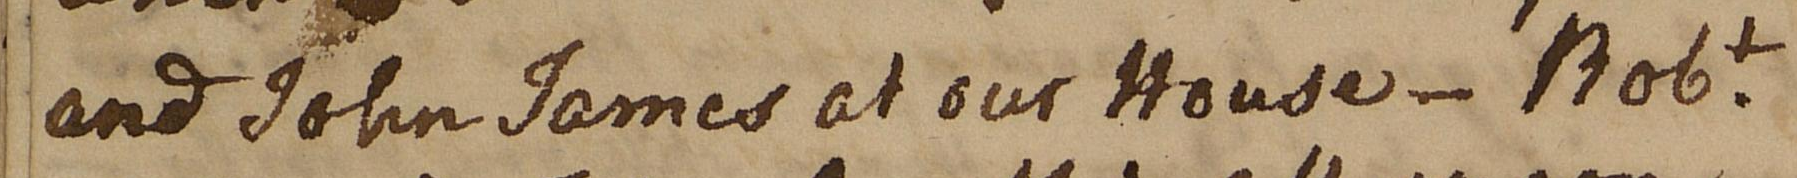and John James at our House- Rob^t.
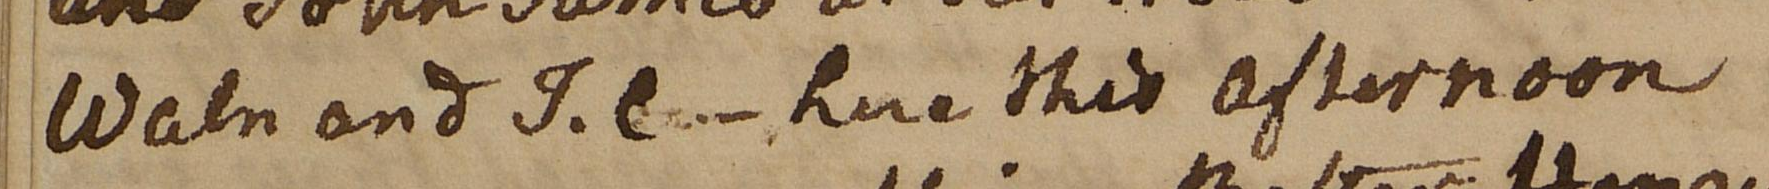Waln and J.C- here this afternoon
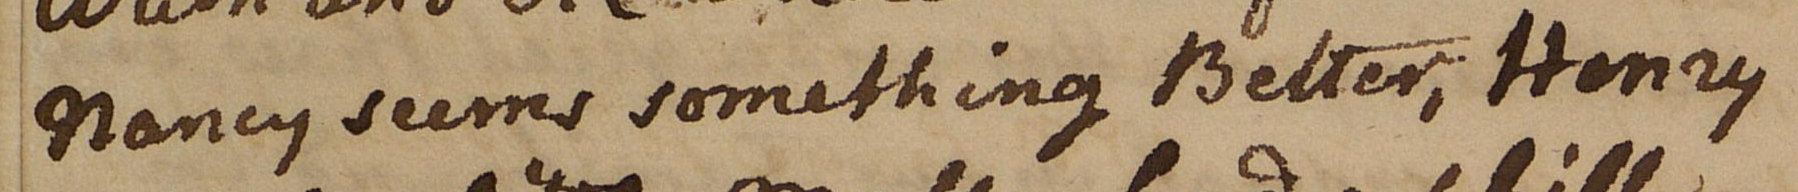Nancy seems something Better, Henry
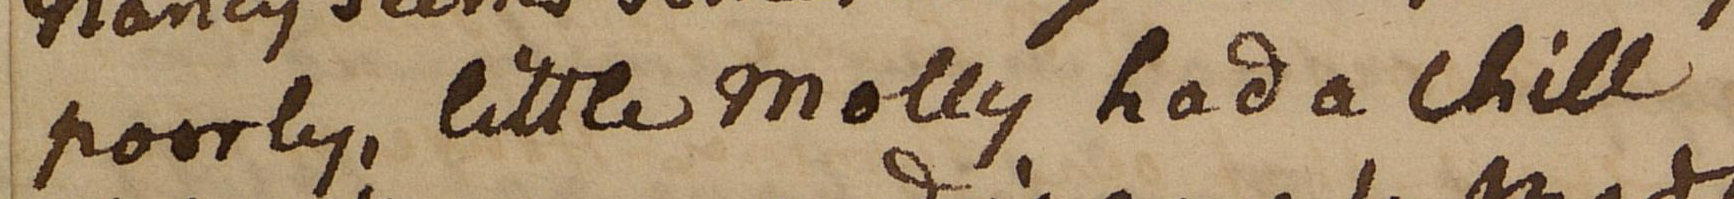poorly, little Molly had a chill
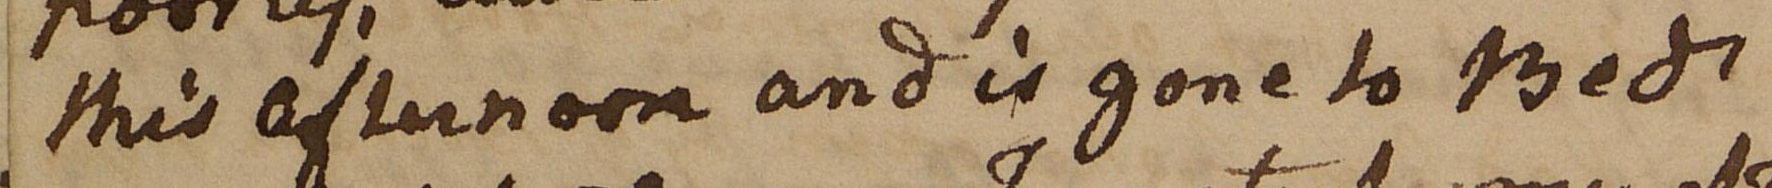this afternoon and is gone to Bed
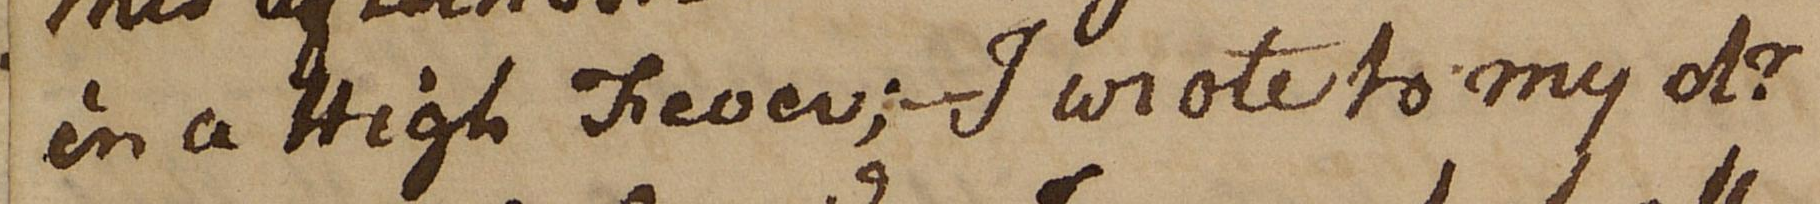in a High Fever;- I wrote to my d^r.
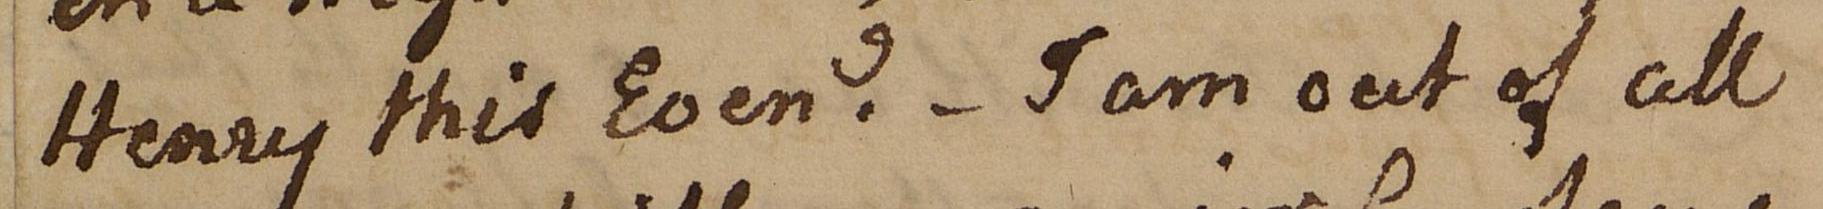Henry this Even^g.- I am out of all
